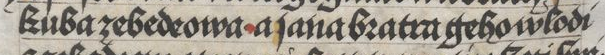kuba zebedeowa.a Iana bratra geho wlodí
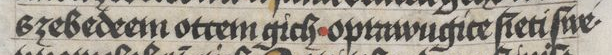s zebedeem otcem gich.oprawugíce ſieti ſwe
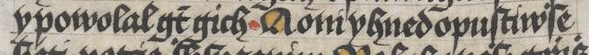y powolal ḡt gich.A oni ihned opuſtiwẛe
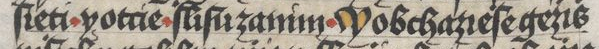ſieti.y otcie.ẛli ſu zanim.Yobchazieẛe geżiṡ
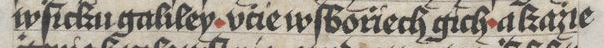wẛicku galiley.vċie w ſboṙiech gich.a każie
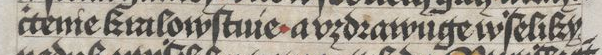ċtenie kralowoſtuíe.a vzdrawuge wẛeliky
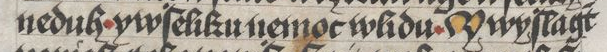neduh.ywẛeliku nemoc wlidu.Y wyẛla ḡt
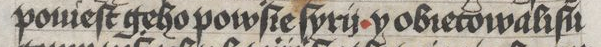pouieſt geho powẛíe ſyrij.y obietowali ſu
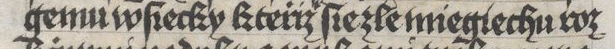gemu wẛiecky kteṙiż ſie zle miegíechu roz¬
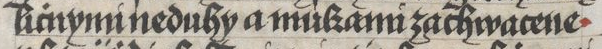liċnymi neduhy a mukami zachwacene.
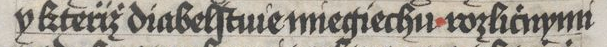kteṙíż diabelſtuie miegíechu.rozliċnymi
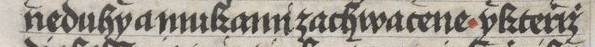neduhy a mukami zachwacene.ykteṙiż
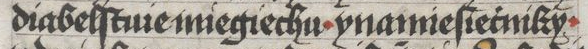diabelſtuie miegiechu.ynamieſieċníky.
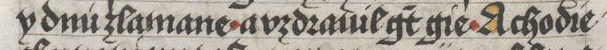y dnú zlamane.a vzdrauil ḡt gie.A chodie¬
